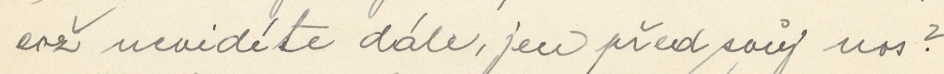což nevidíte dále, jen před svůj nos?
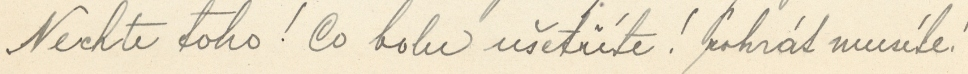Nechte toho! Co bolu ušetříte! Prohrát musíte!
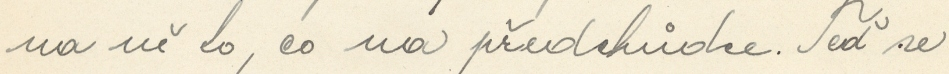na ně to, co na předchůdce. Teď se
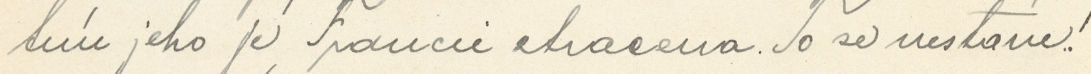tím jeho je Francie ztracena. To se nestane!
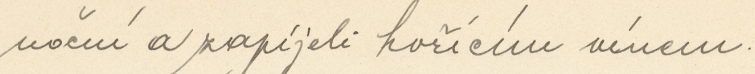noční a zapíjeli hořícím vínem.
